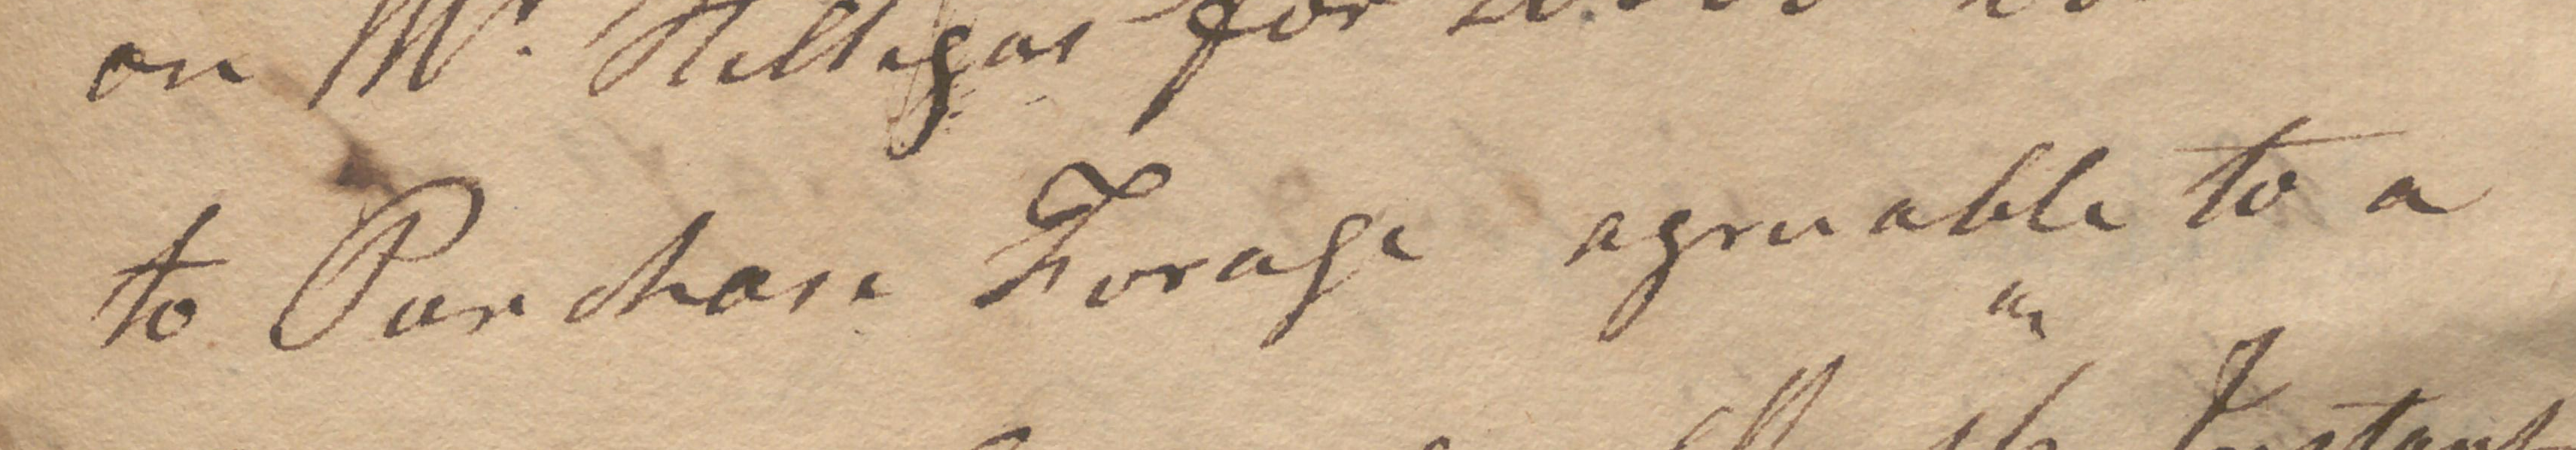to Purchase Forage agreeable to a
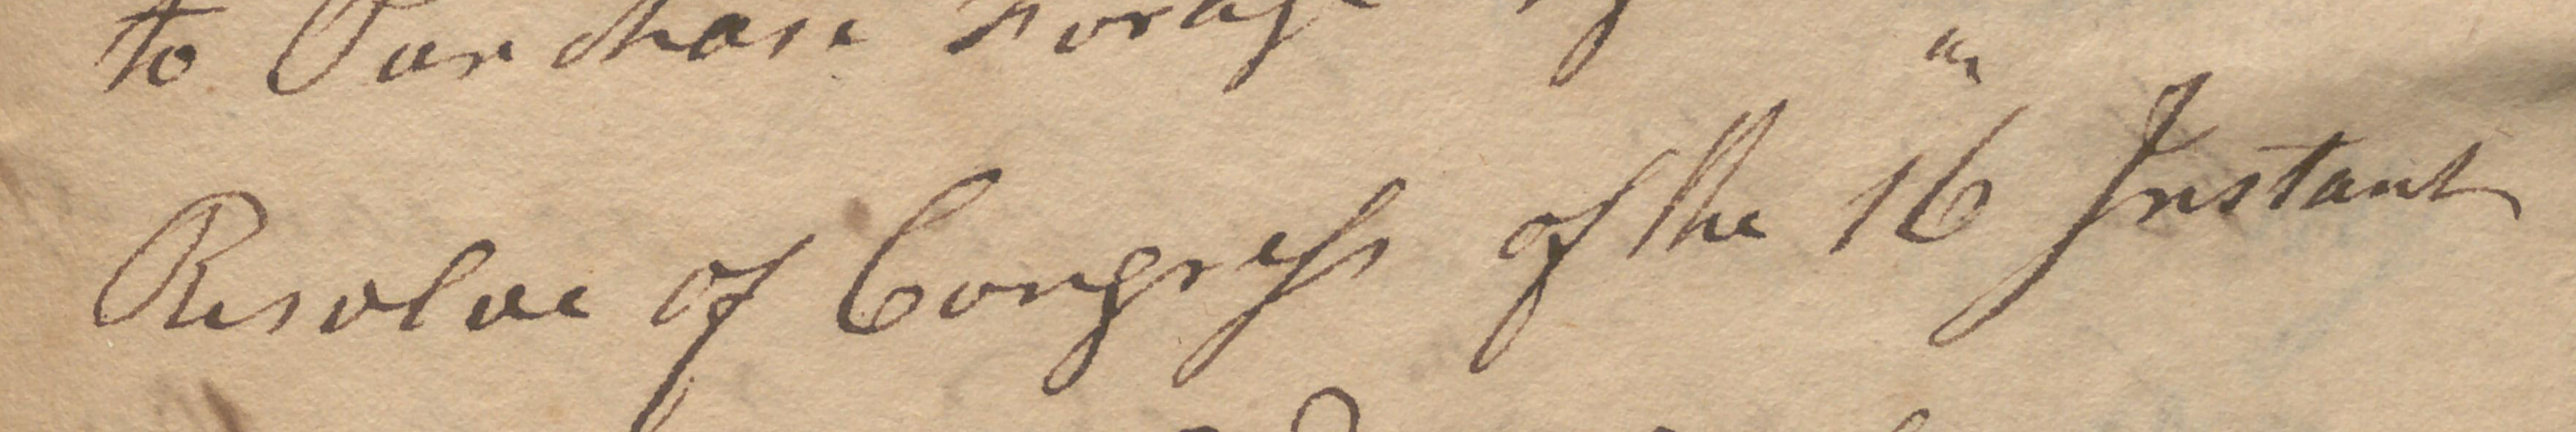Resolve of Congress of the 16^th Instant
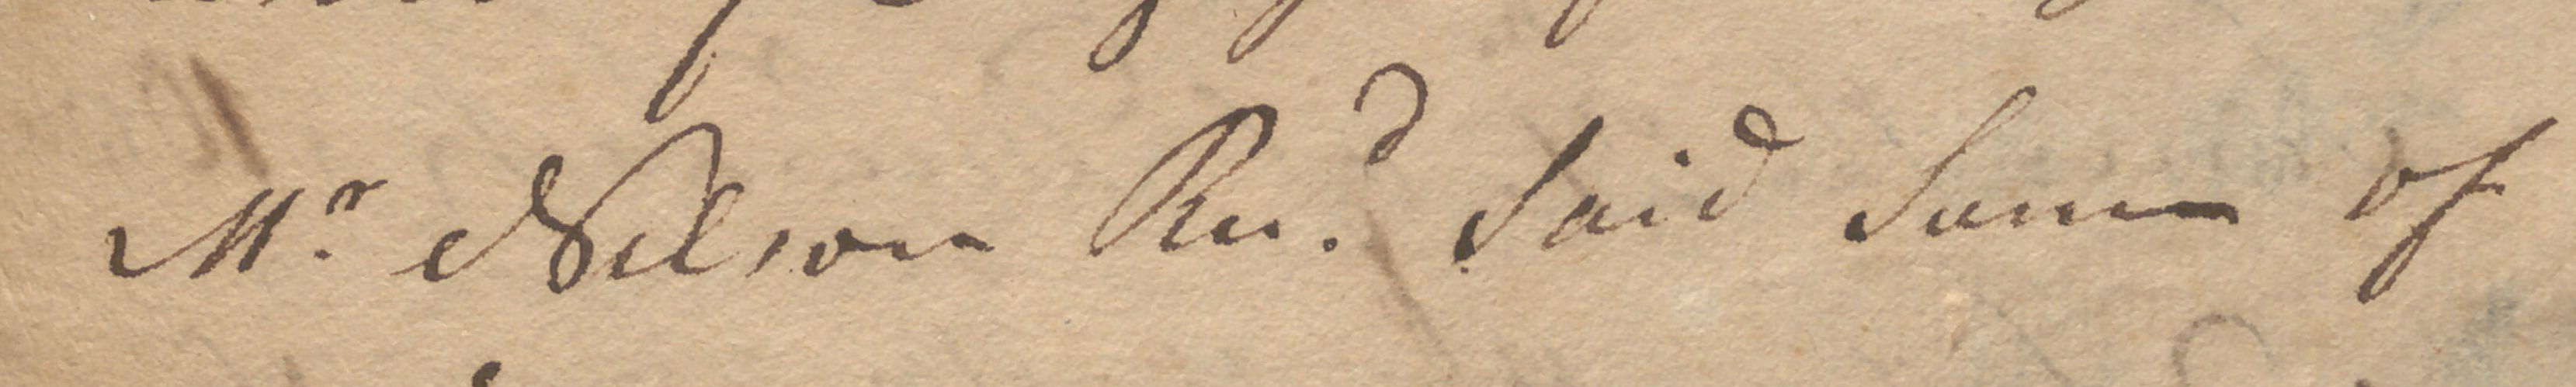M^r. Nelson Rec^d. said sum of
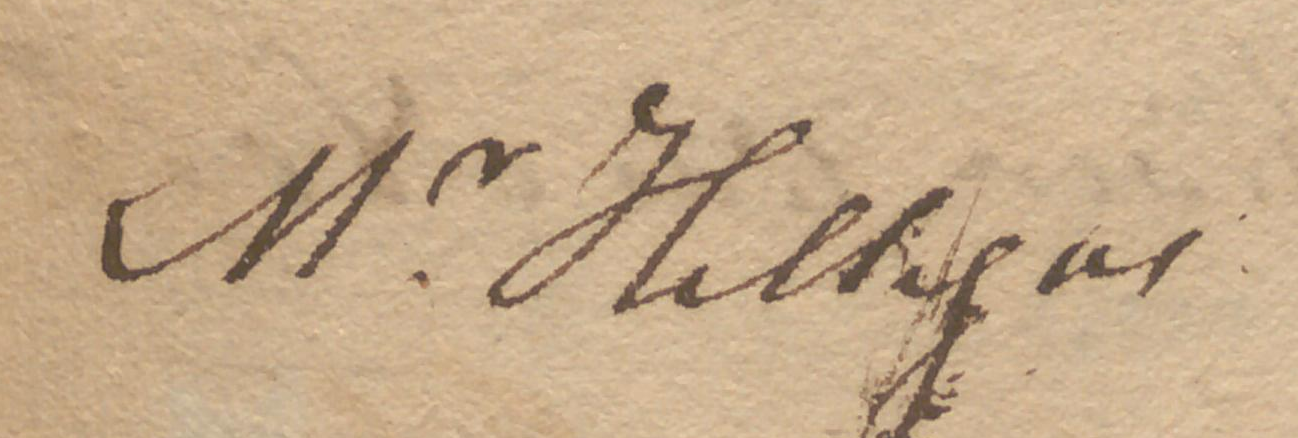M^r Hilligas
